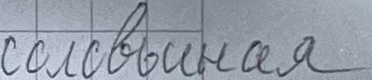соловьиная
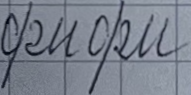фифи
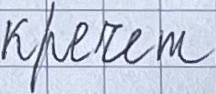кречет
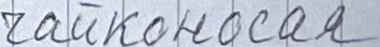чайконосая
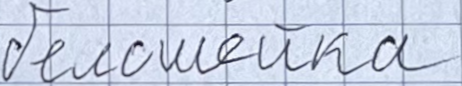белошейка
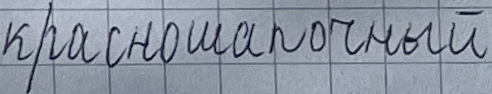красношапочный
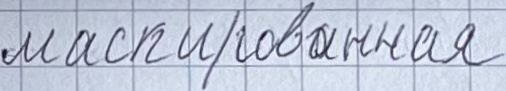маскированная
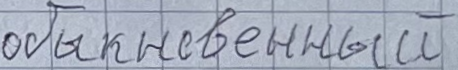обыкновенный
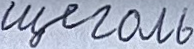щеголь
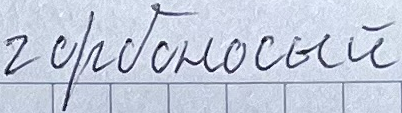горбоносый
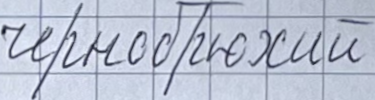чернобрюхий
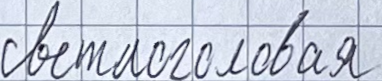светлоголовая
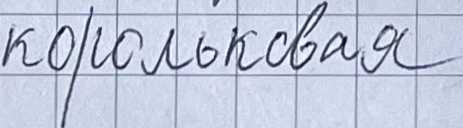корольковая
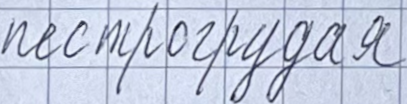пестрогрудая
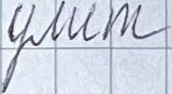улит
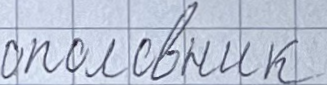ополовник
